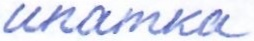ипатка
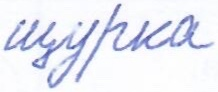щурка
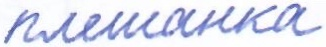плешанка
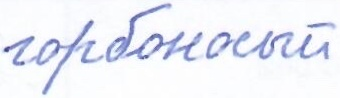горбоносый
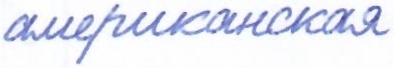американская
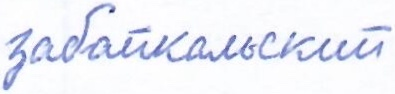забайкальский
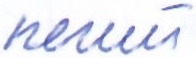пегий
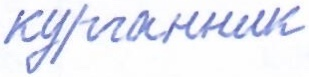курганник
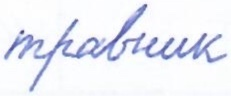травник
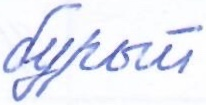бурый
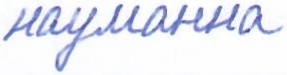науманна
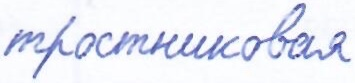тростниковая
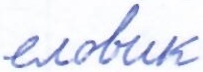еловик
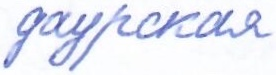даурская
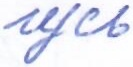гусь
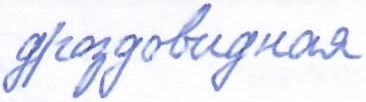дроздовидная
